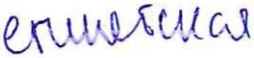египетская
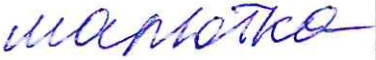малютка
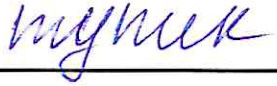тупик
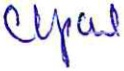серая
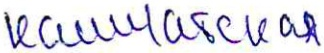камчатская
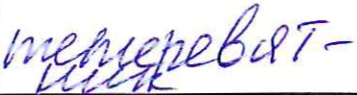тетеревят-ник
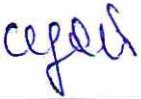седой
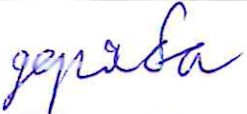деряба
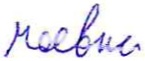моевка
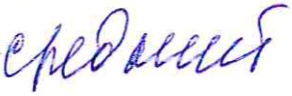средний
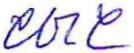сыч
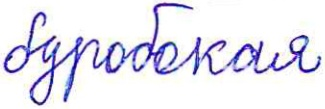буробокая
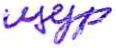щур
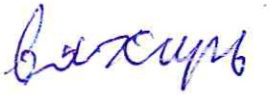вяхирь
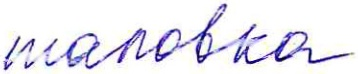таловка
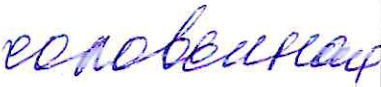соловьиная
